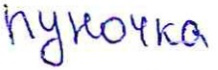пуночка
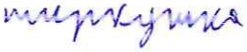тиркушка
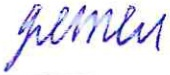дятел
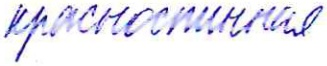красноспинная
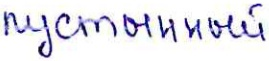пустынный
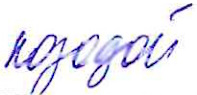козодой
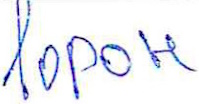ворон
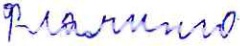фламинго
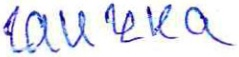гаичка
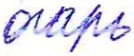огарь
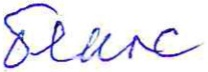бекас
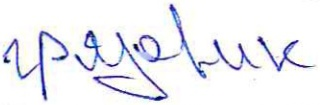грязовик
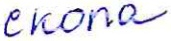скопа
